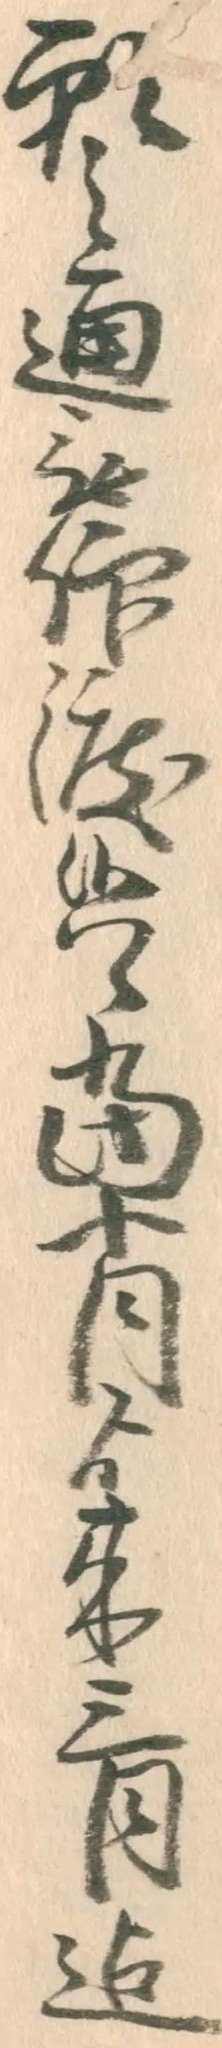願之通被仰渡候ハヽ当十月ゟ来三月迄
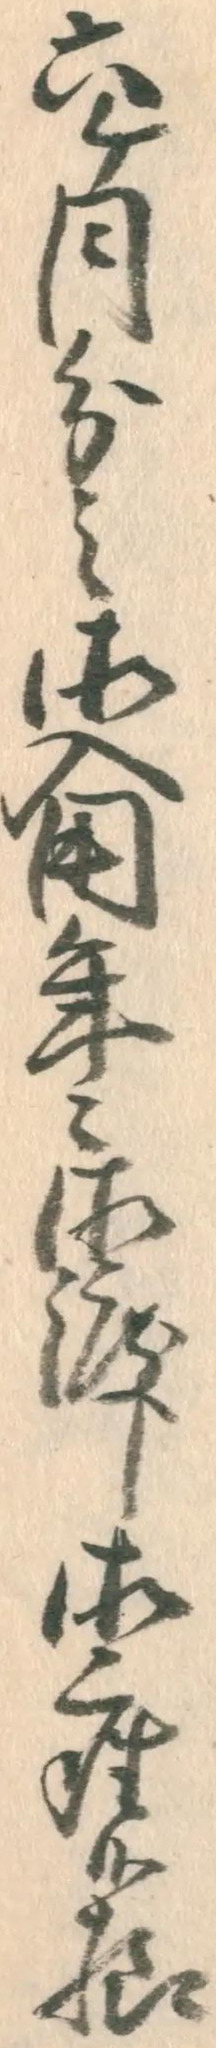六ケ月分之御入用年々御渡し御座候様
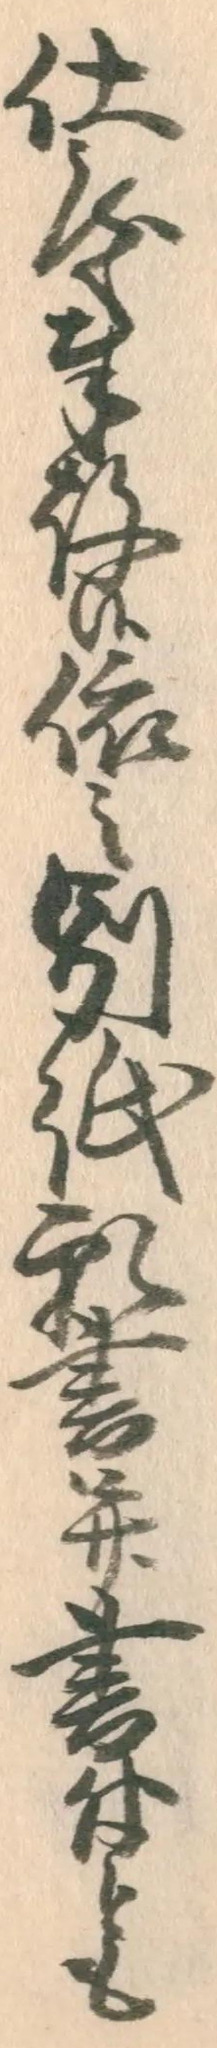仕度奉存候依之別紙願書并書付とも
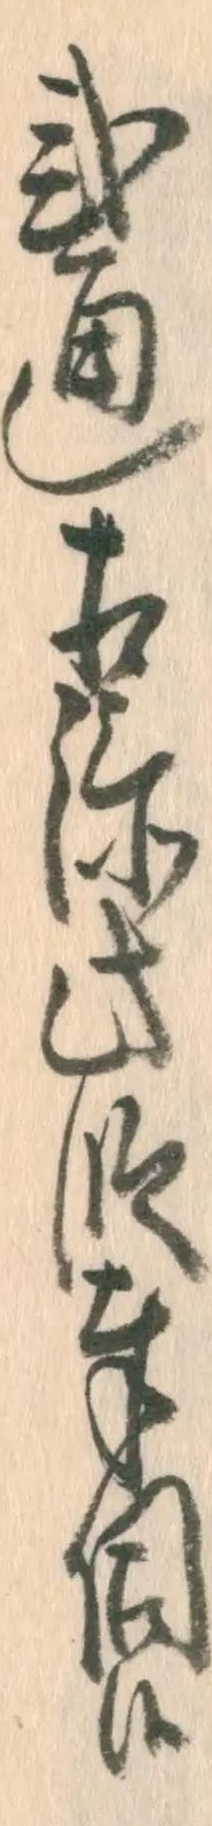弐通相添此段奉伺候
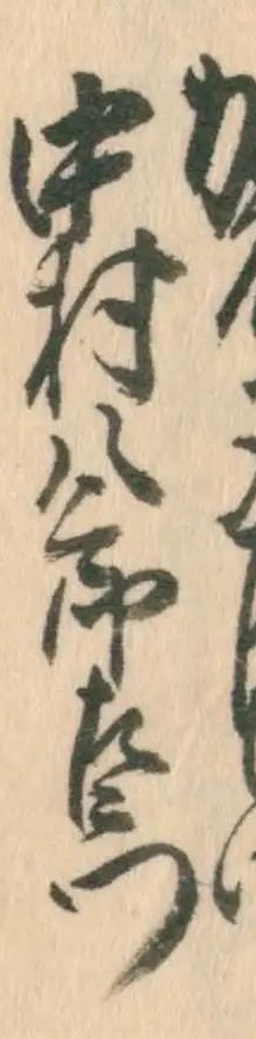中村八郎左衛門

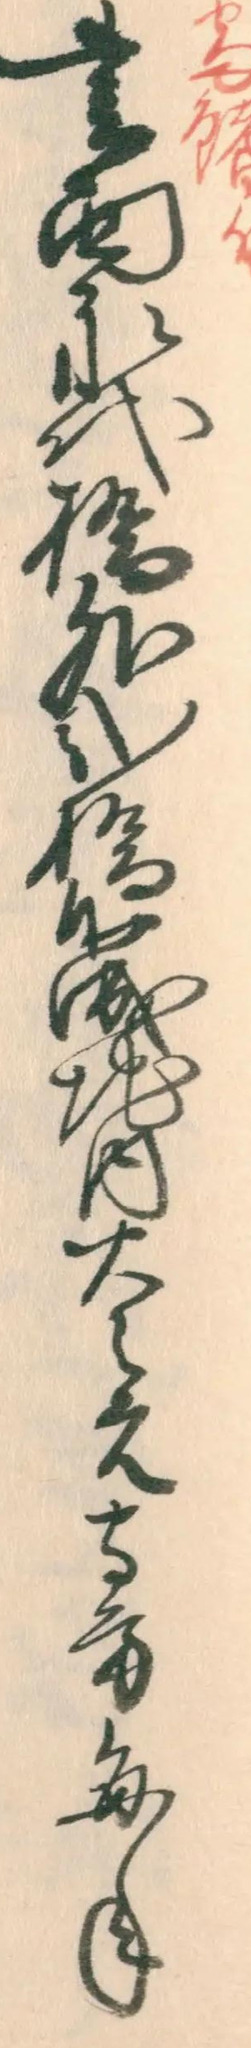書面永代橋外弐橋助成地内火之元守方毎年
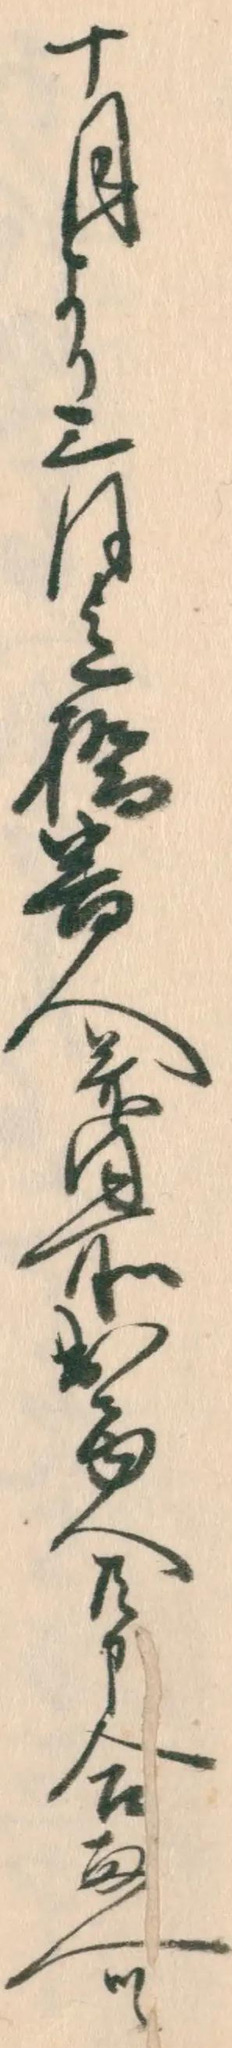十月より三月迄橋番人并同所出商人共申合両人ツヽ
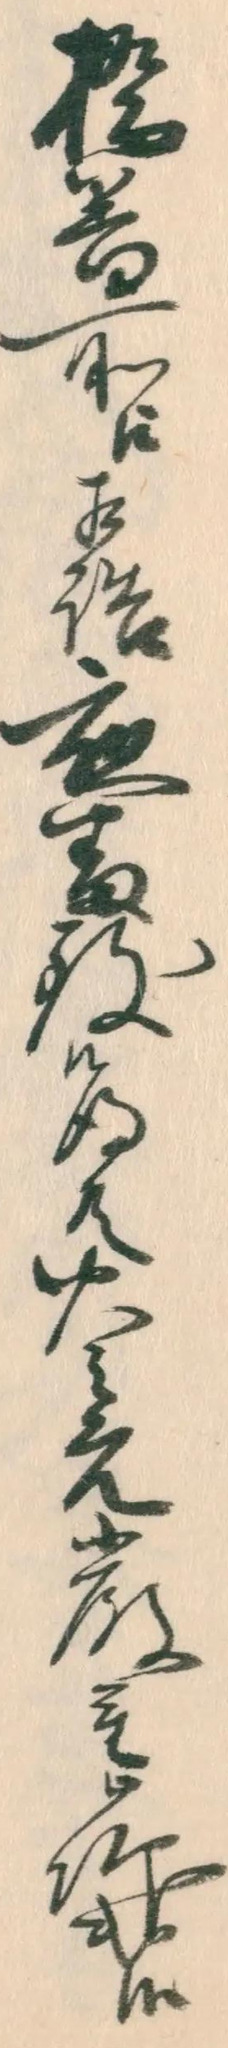橋番所え相詰夜番致候得共火之元厳重被仰出候
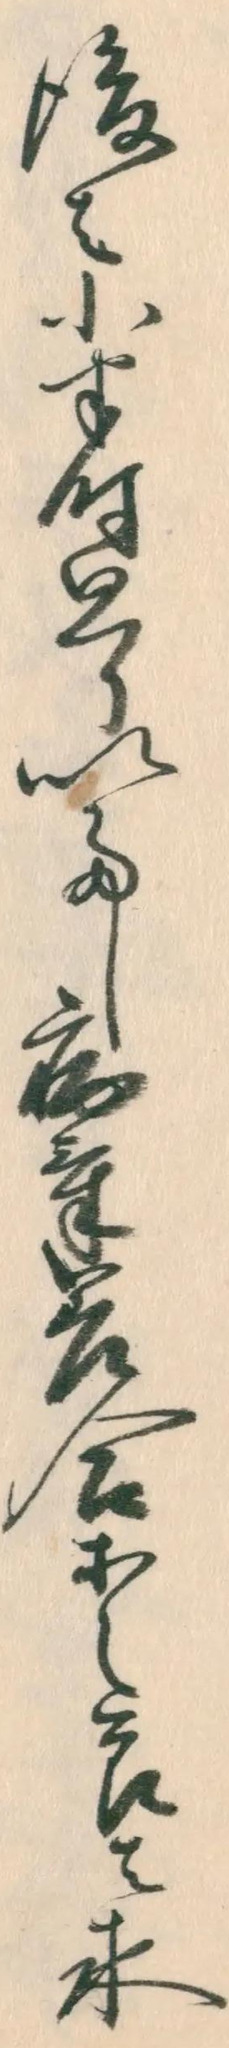後は小半時廻りいたし病気差合等之節は来
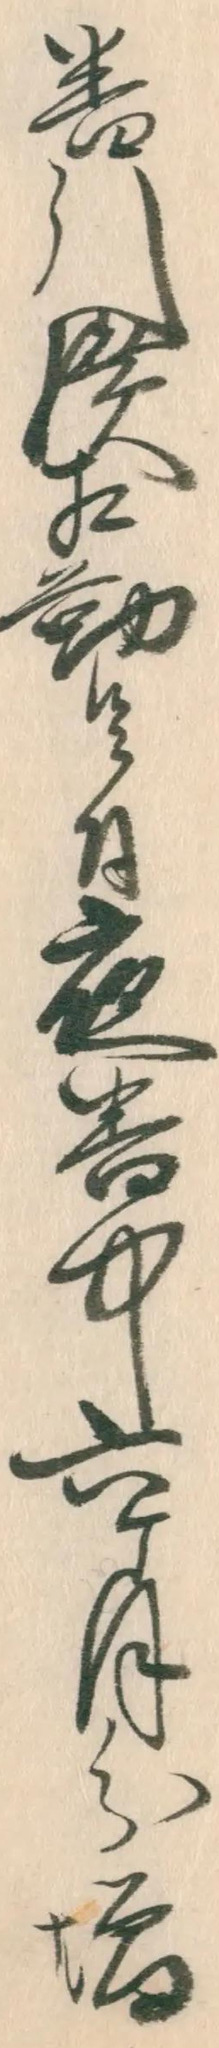番引続相勤候ニ付夜番中六ケ月分増
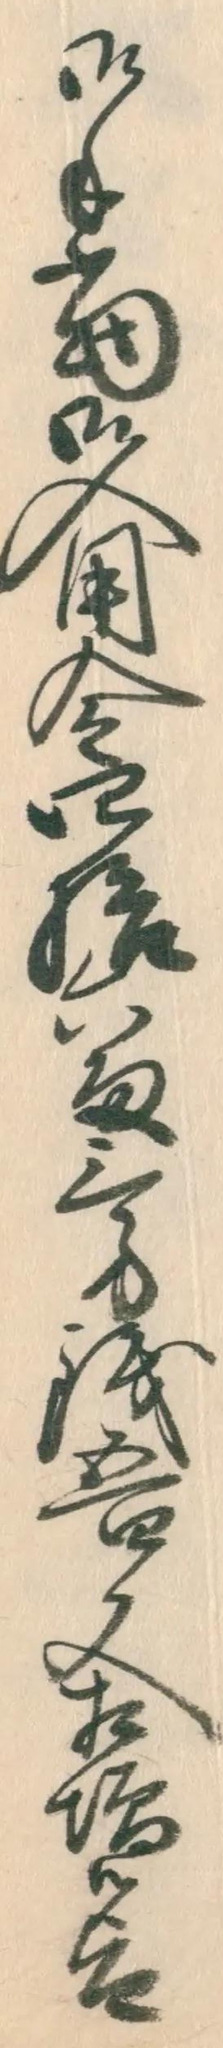御手当御入用金四拾六両三分銭五百文相増候旨

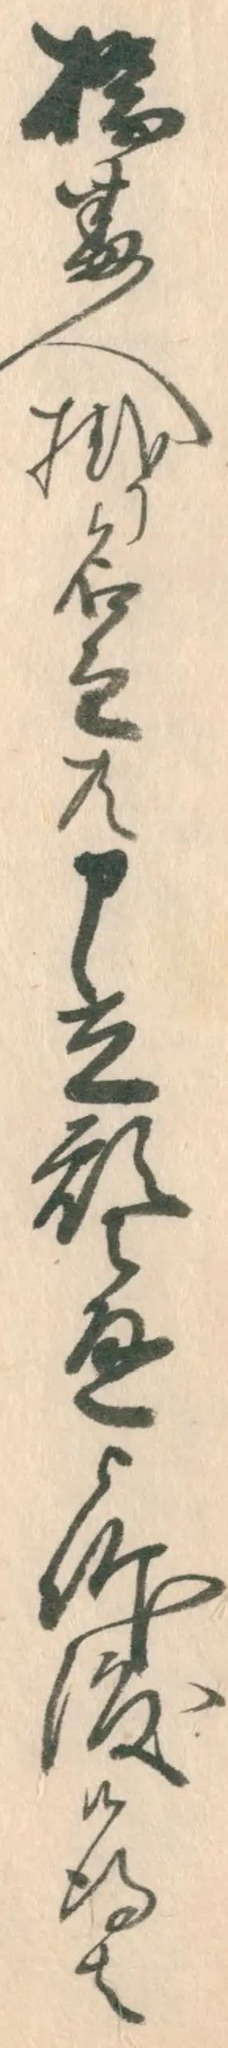橋番人掛り名主共申立願之通被仰渡候得は
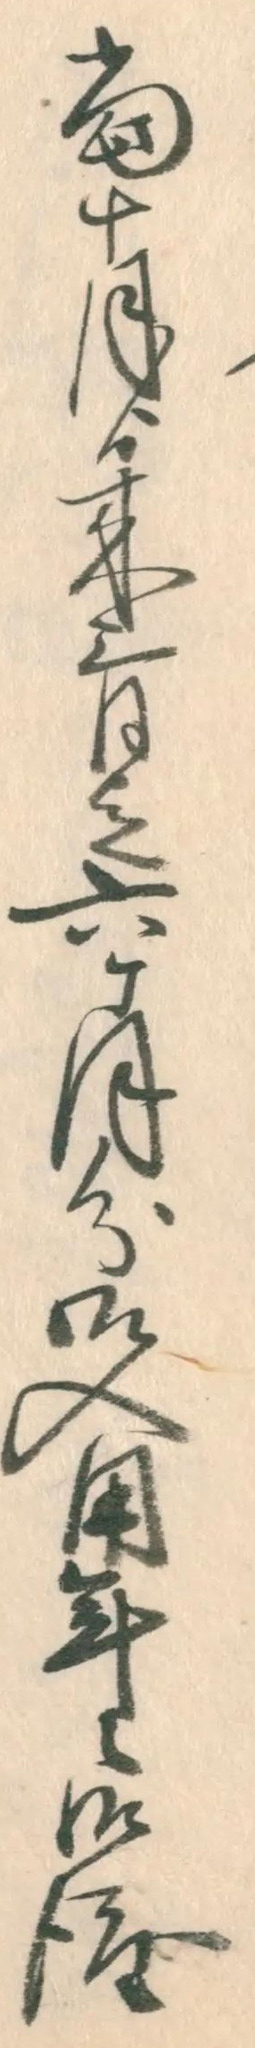当十月ゟ来三月迄六ケ月分御入用年々御渡
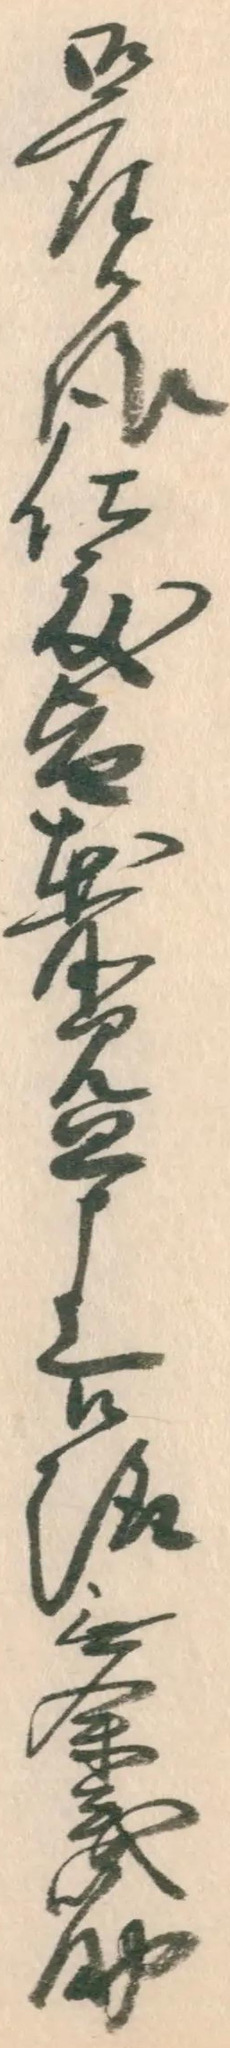御座候様仕度旨本所見廻申上候趣無余義筋
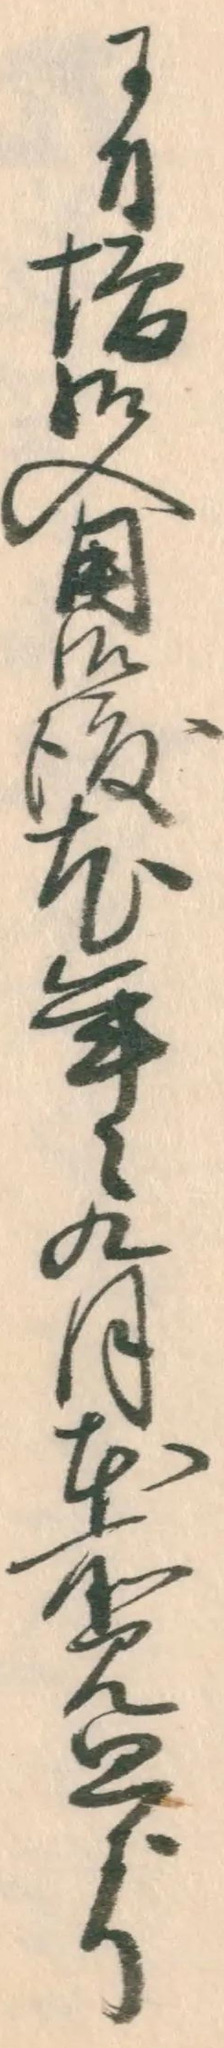に付増御入用御渡尤年々九月本所見廻より
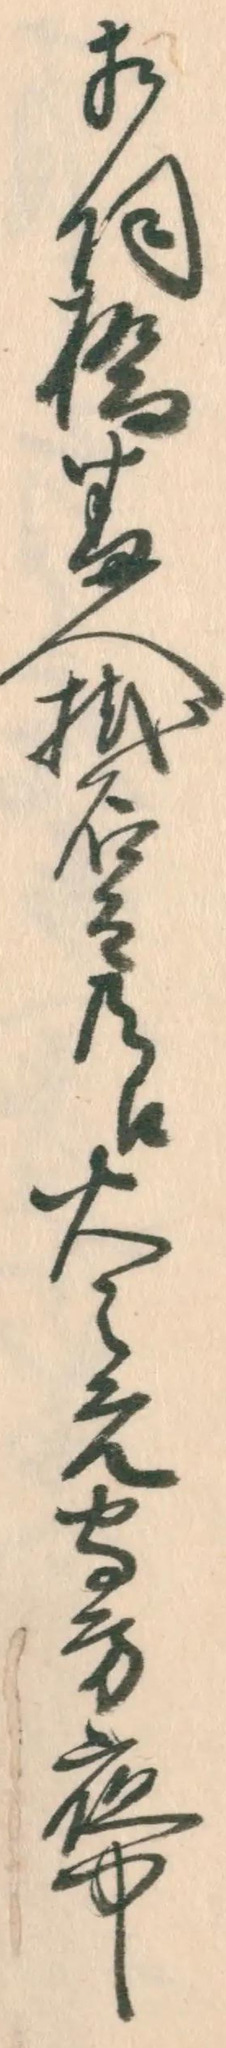相伺橋番人掛名主共え火之元守方夜中
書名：三橋 17巻. [7] 三橋小破御修復書留　但御奉行御掛リ替地震潰橋番屋　嘉永四亥年より安政二卯年迄　上
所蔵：国立国会図書館 National Diet Library, JAPAN
